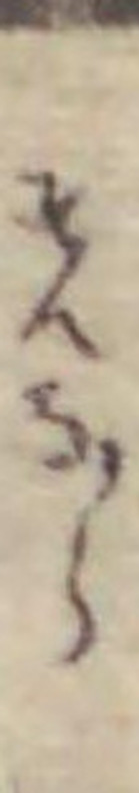そんなら
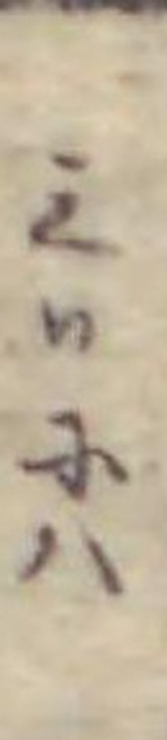三日には
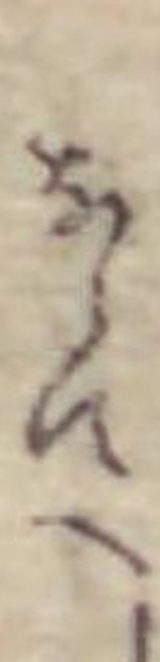ならすへ
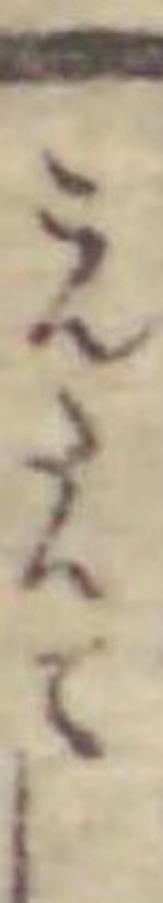こんたんて
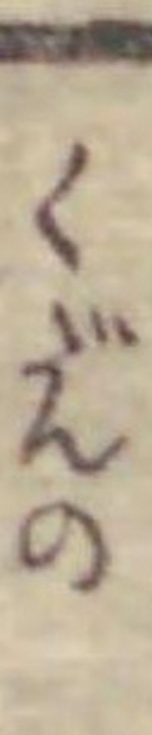くだんの
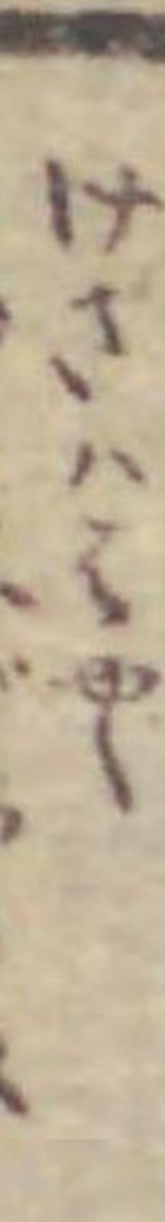けさははやく
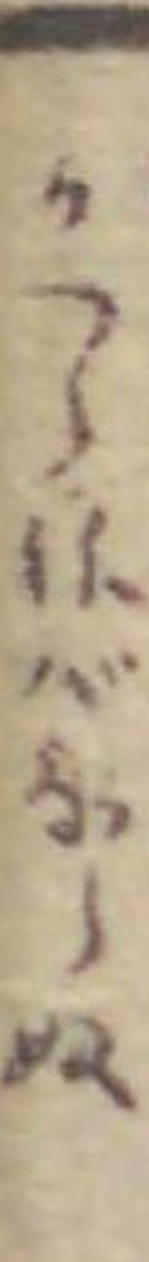かへらねばならぬ
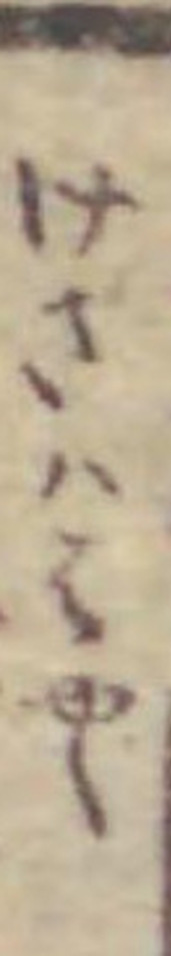けさははやく
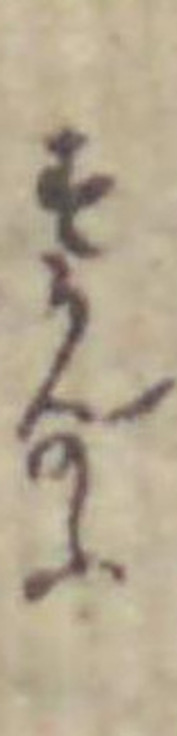すかんのふ
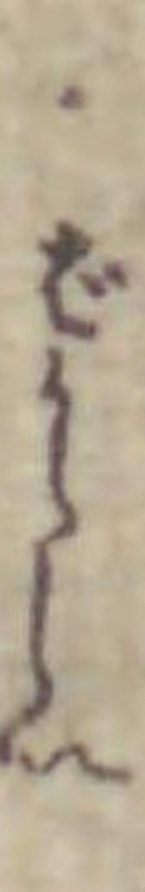ばからしい

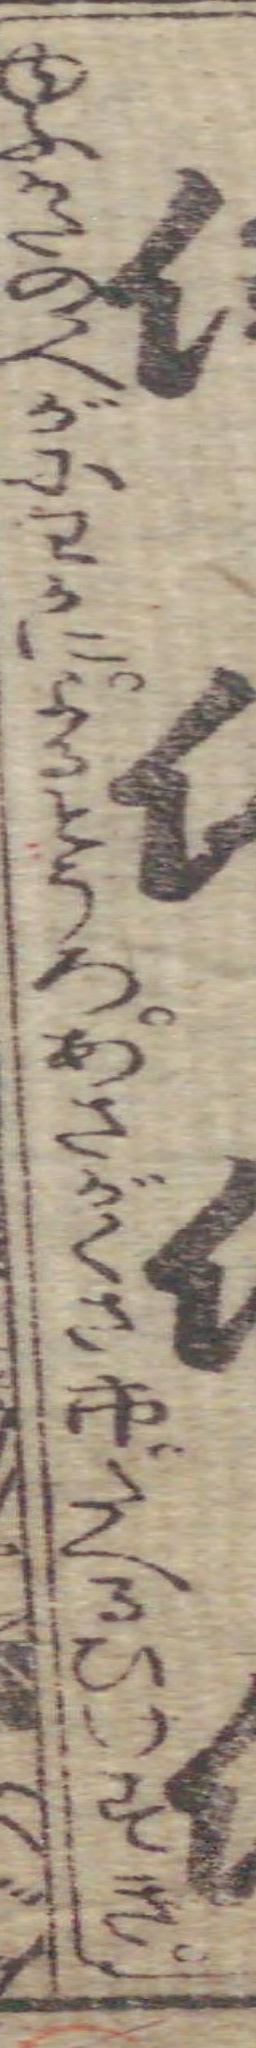ゆふかたの人がにわかに。よるとうろ。あさがくさ市。たへるひけすき。
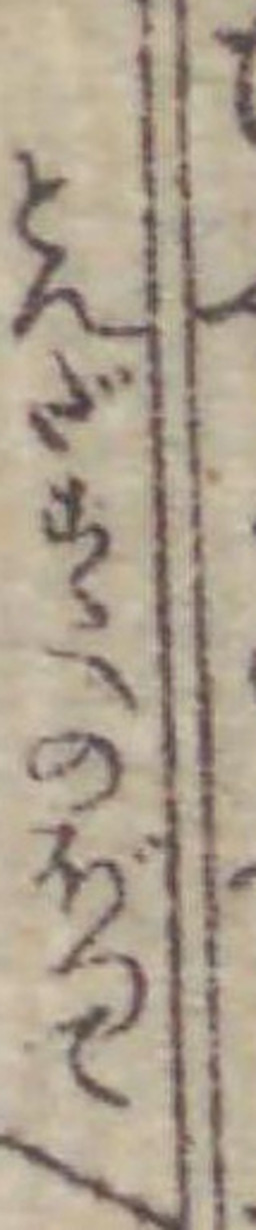とんだすゝへのぼつて
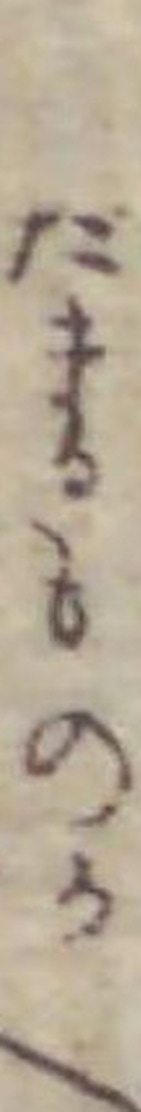たまるものか
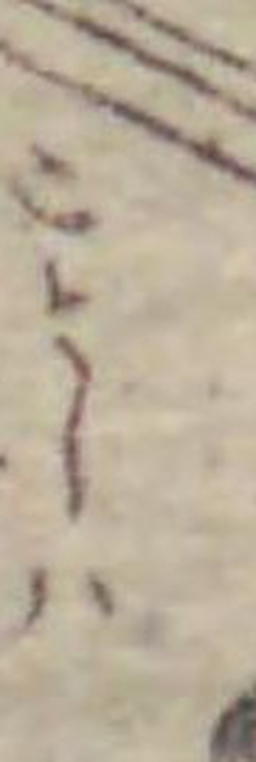ことしは
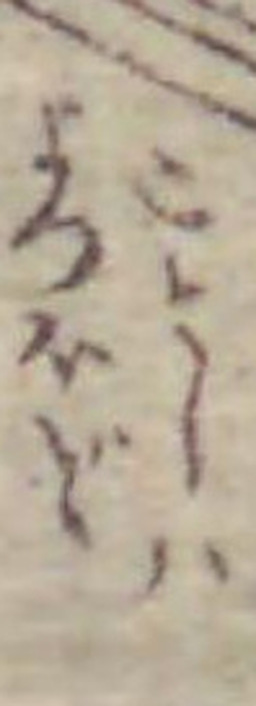よつほど
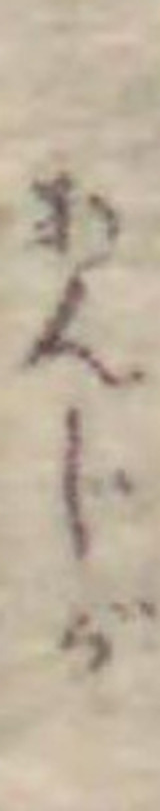あんじが
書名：郭𦽳費字尽 : 3巻
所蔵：国立国会図書館 National Diet Library, JAPAN
